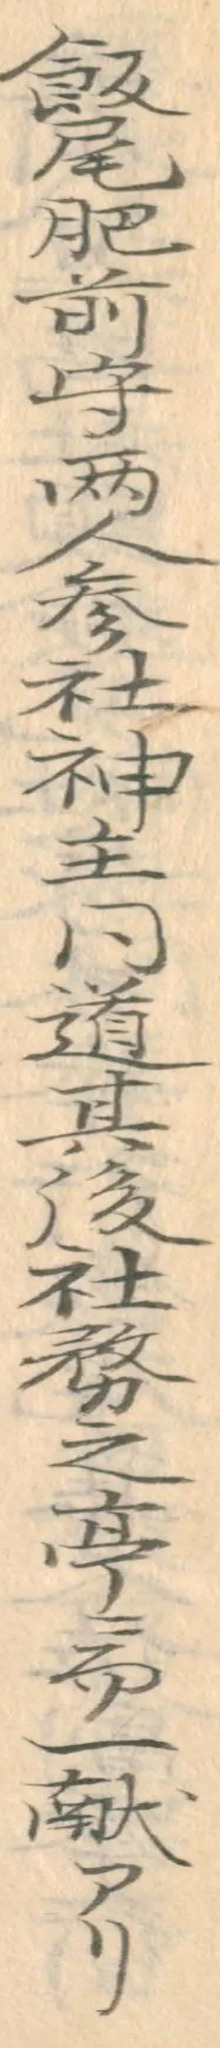飯尾肥前守両人参社神主同道其後社務之亭ニ而一献アリ
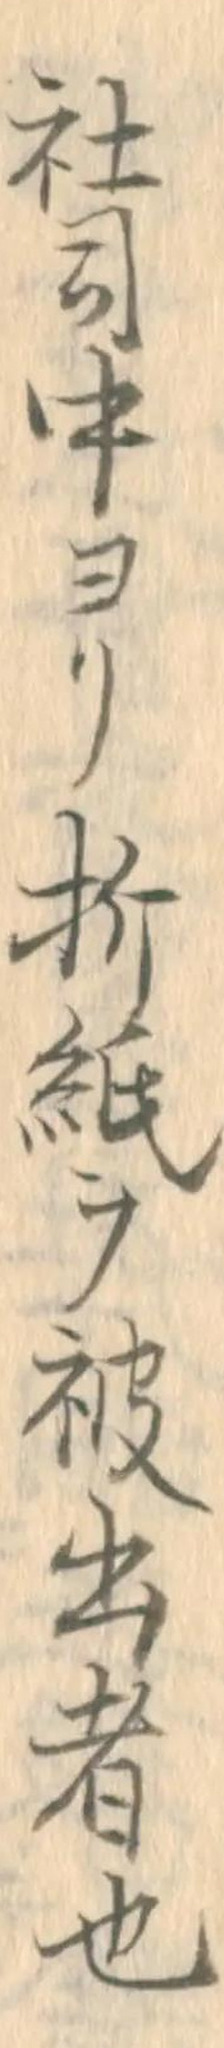社司中ヨリ折紙ヲ被出者也
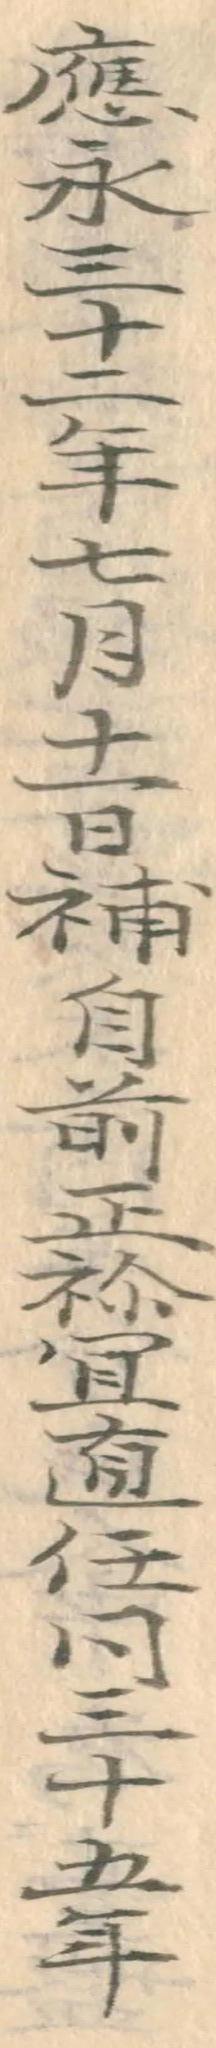応永三十二年七月十一日補自前正祢宜直任同三十五年
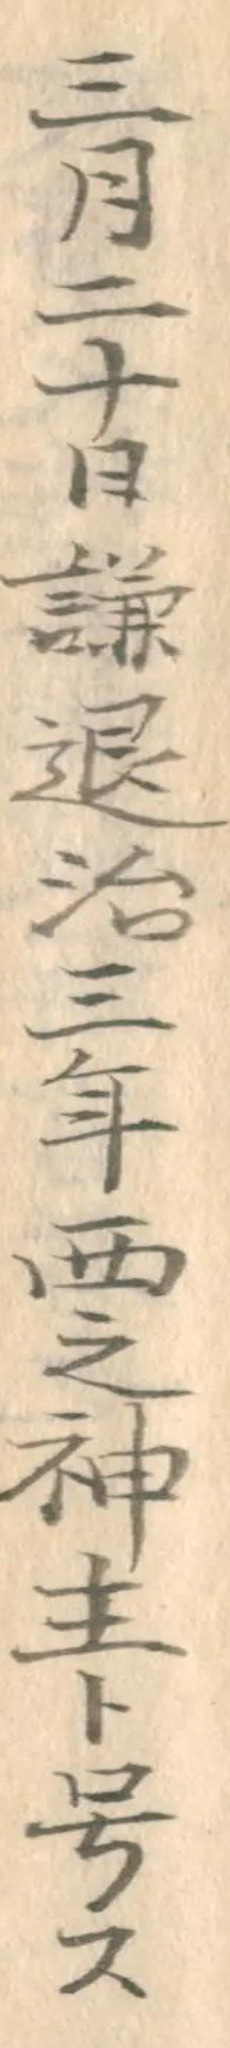三月二十日謙退治三年西之神主ト号ス
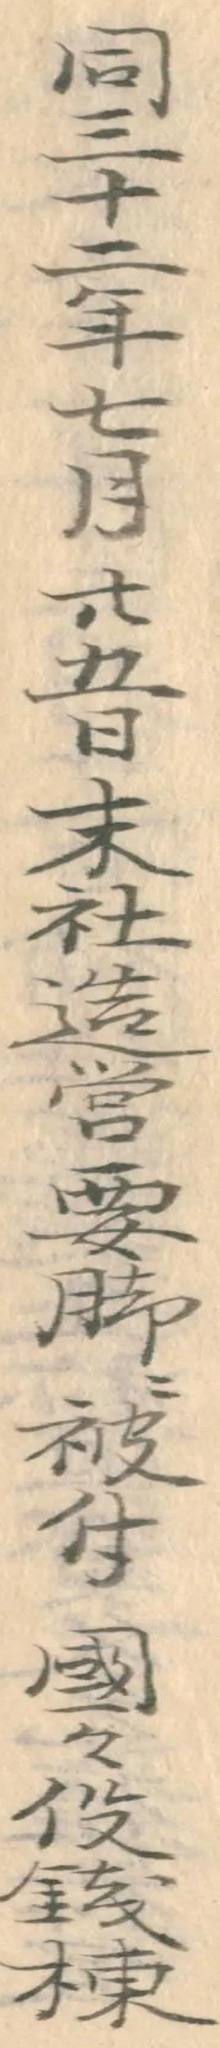同三十二年七月廿五日末社造営要脚ニ被付国々役銭棟
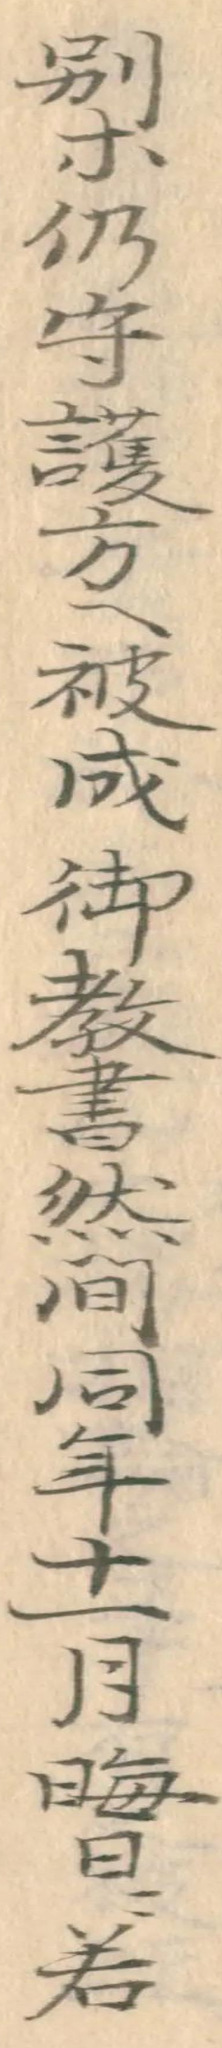別等仍守護方へ被成御教書然間同年十一月晦日ニ若
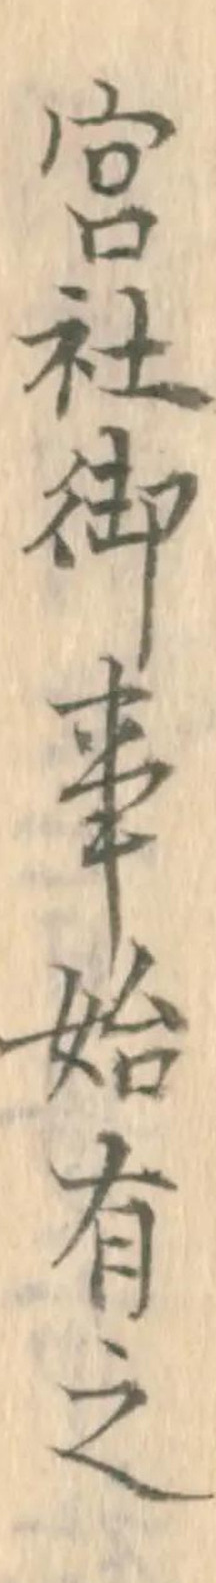宮社御事始有之
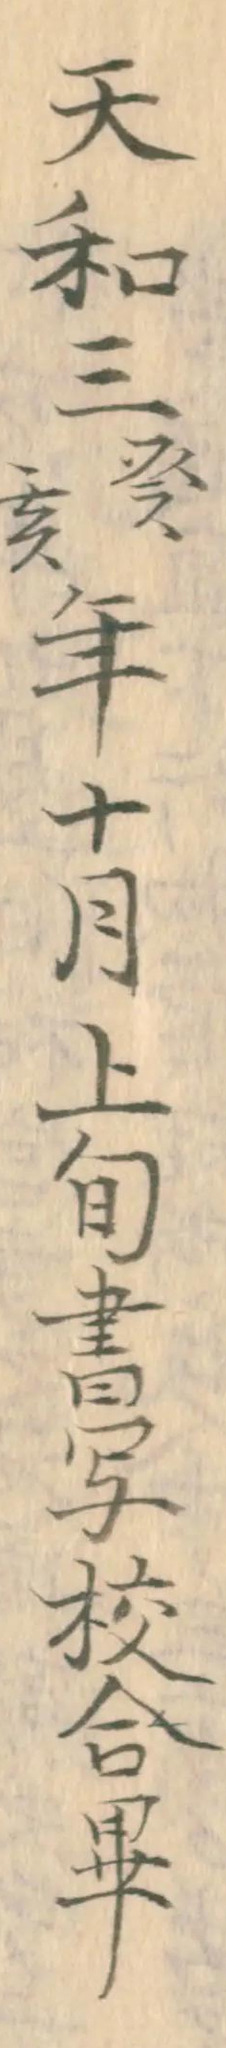天和三癸亥年十月上旬書写校合畢
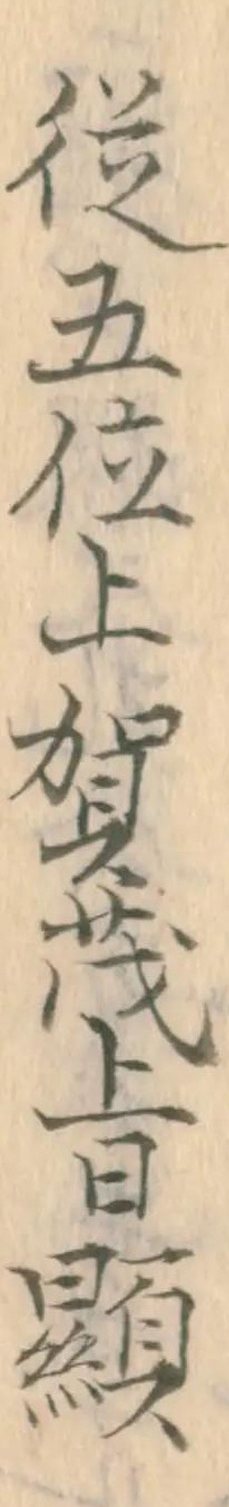従五位上賀茂旨顕
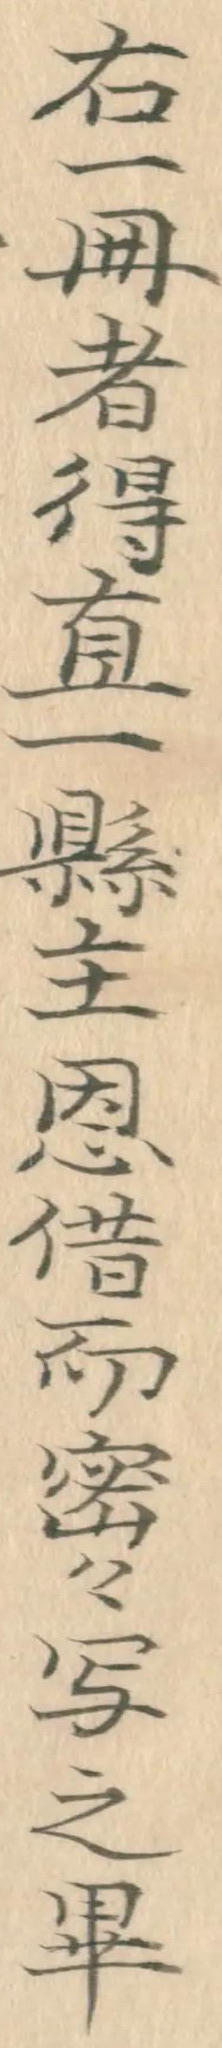右一冊者得直一県主恩借而密々写之畢
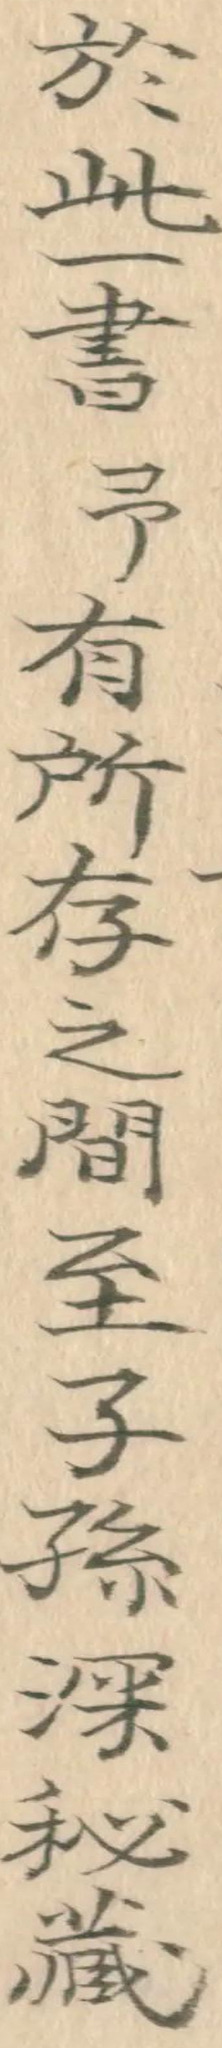於此一書予有所存之間至子孫深秘蔵
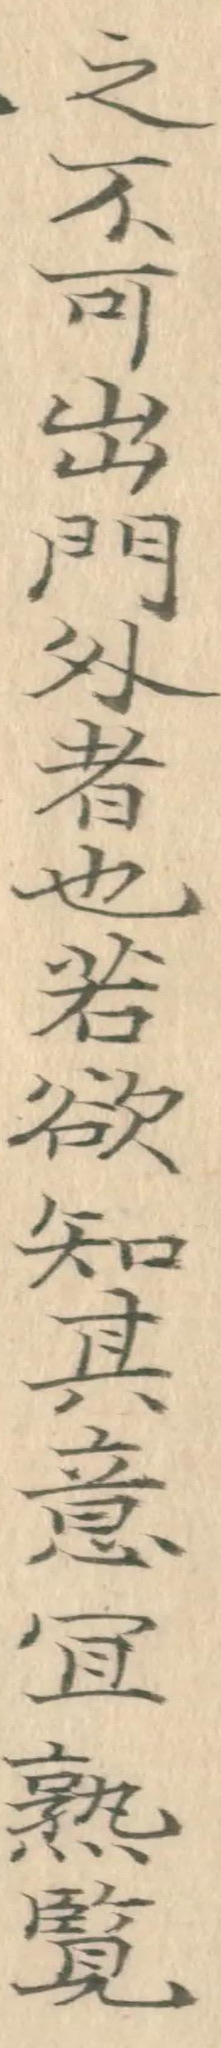之不可出門外者也若欲知其意宜熟覧
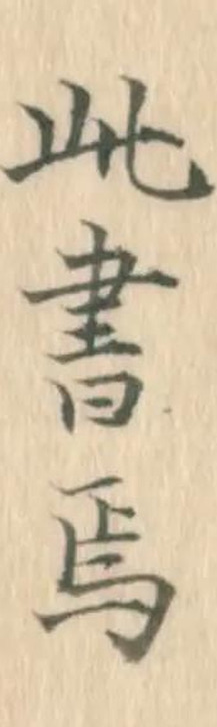此書焉

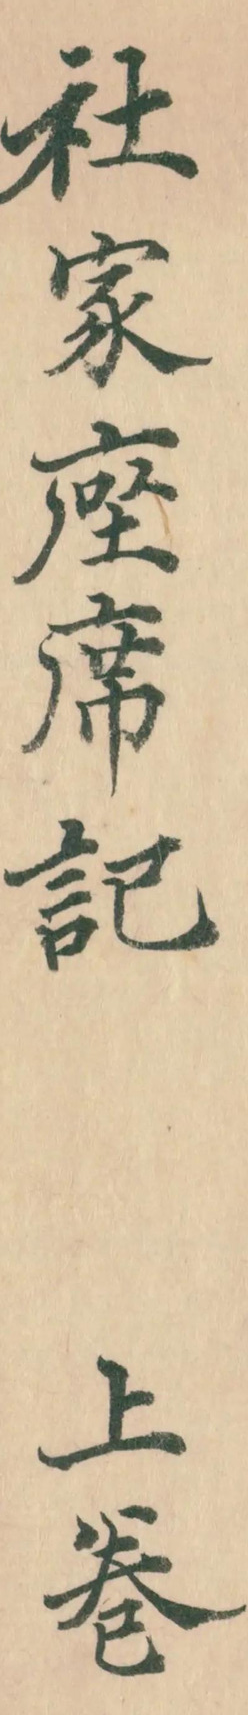社家座席記上巻

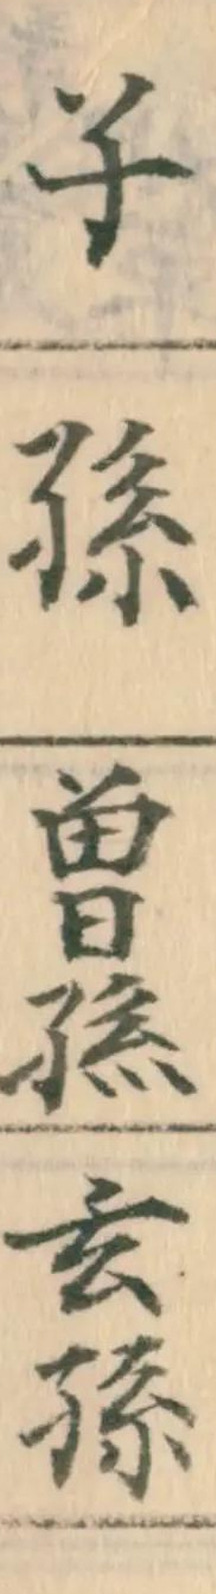子孫曽孫玄孫
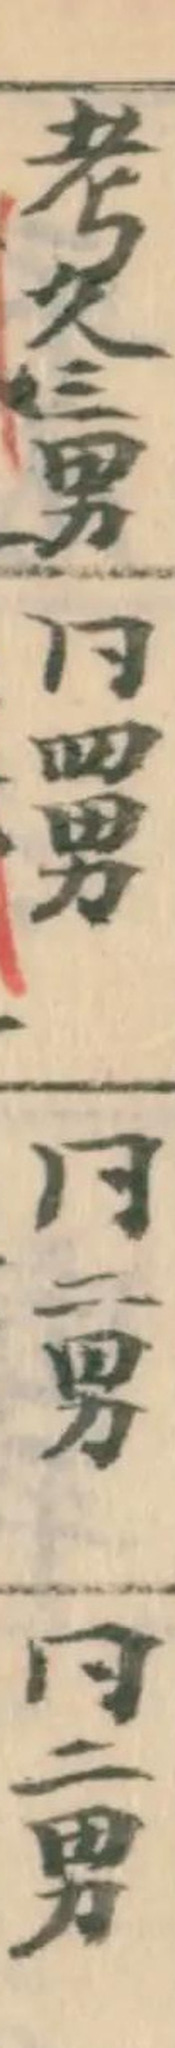考久三男同四男同二男同二男
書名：賀茂社記録. 第24冊
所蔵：国立国会図書館 National Diet Library, JAPAN
